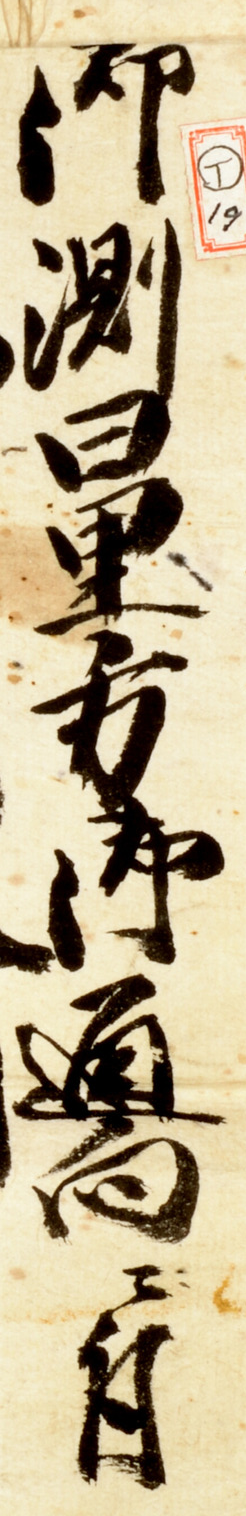御測量方御通向ニ付
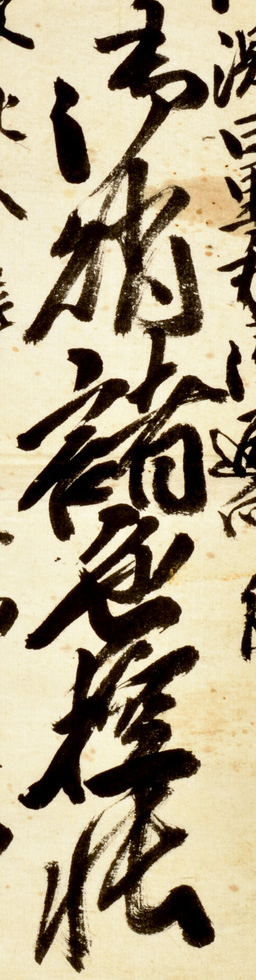御賄諸色控帳
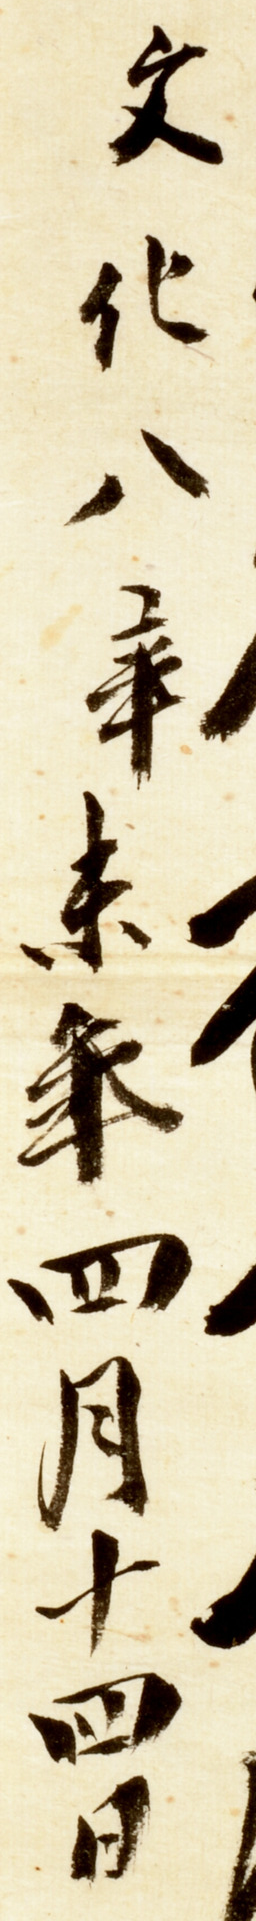文化八辛未年四月十四日

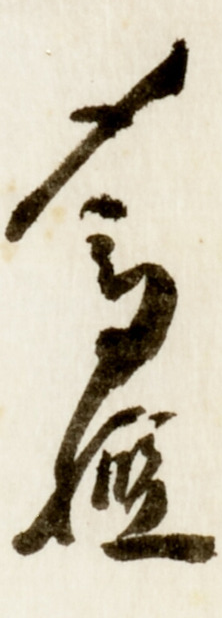〆高控
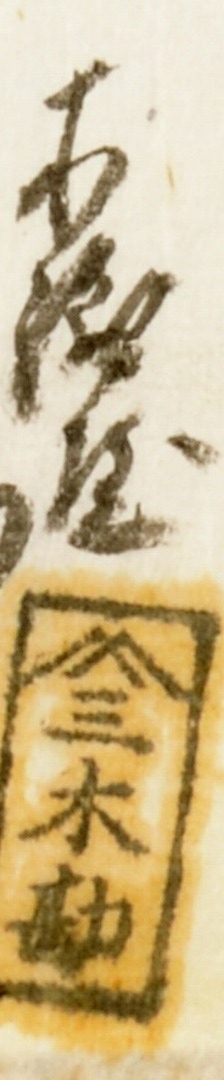木綿屋三木勘
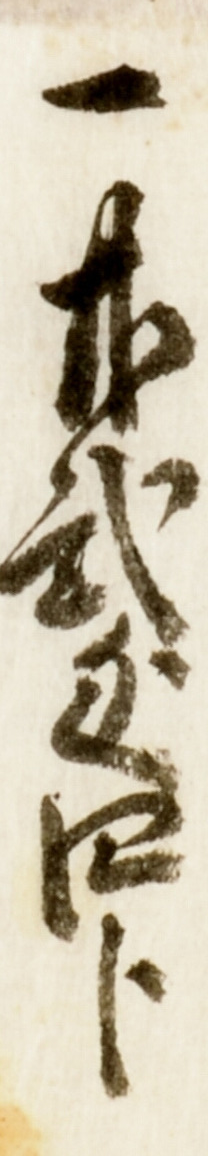一廿弐匁四分
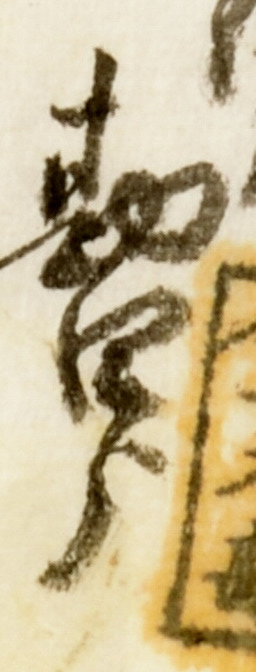勘四郎
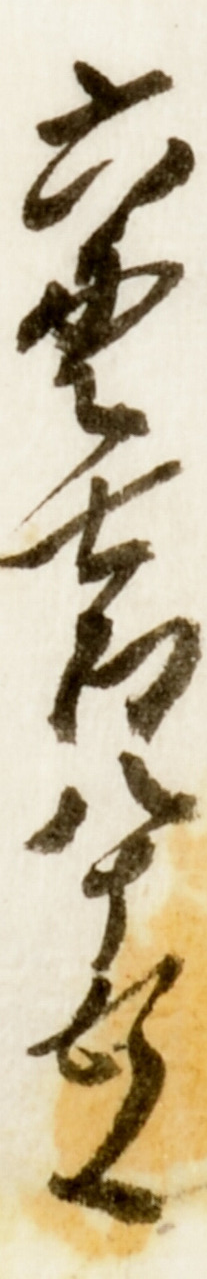六貫七百八十五文

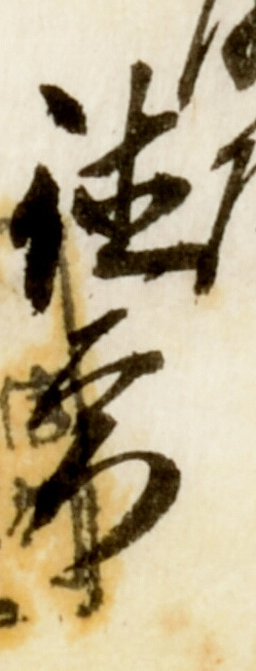徳右衛門
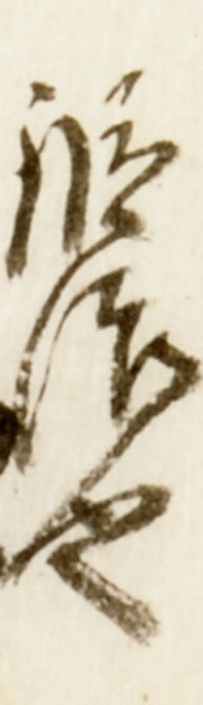鍛冶や
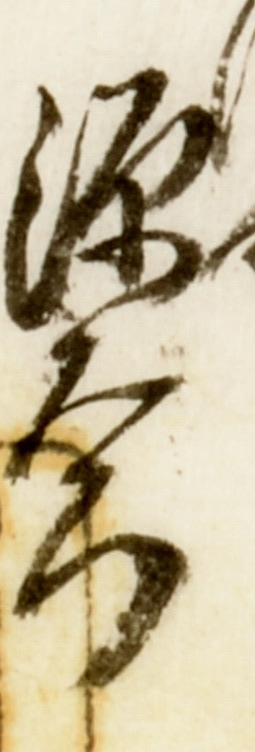源右衛門
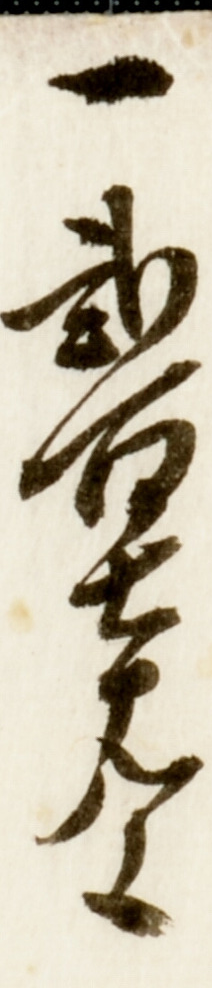一弐百七十八文
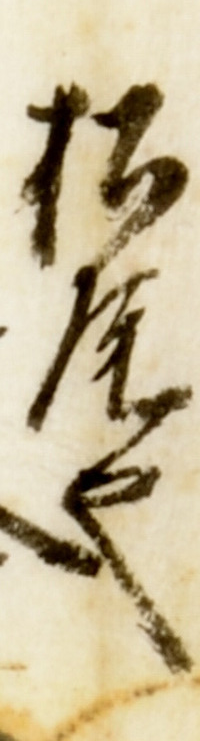松尾や
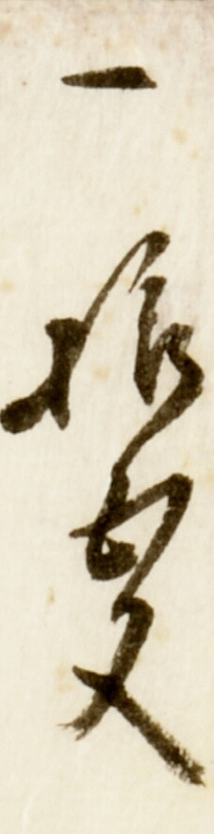一拾五文
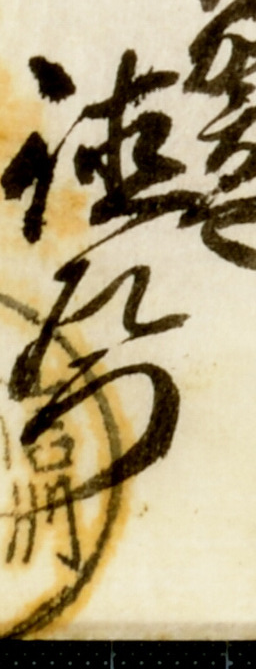徳左衛門

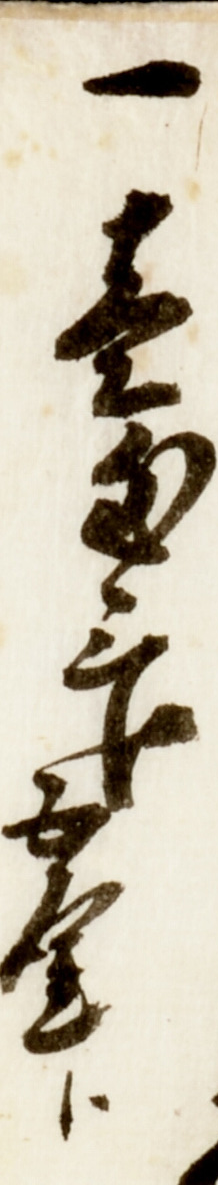一壱匁三分五厘ト
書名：御賄諸色控帳
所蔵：伊那市立高遠町図書館・合同会社AMANE
